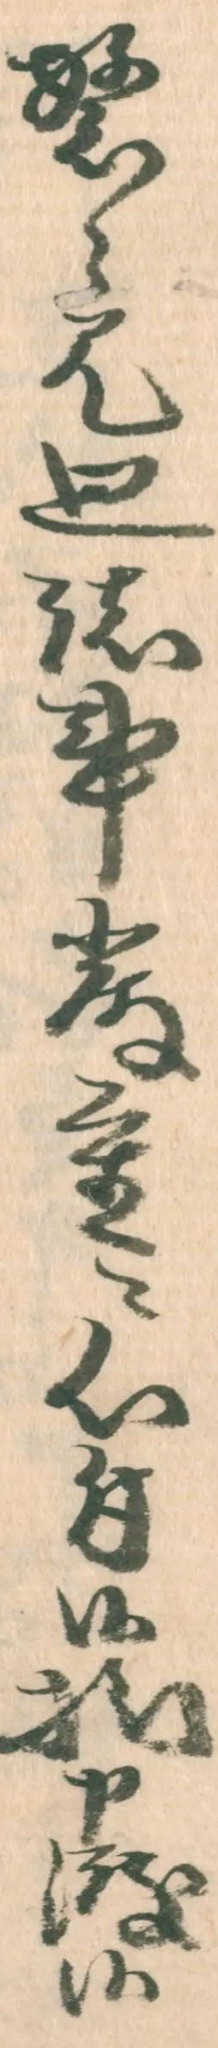繁〻見廻諸事厳重ニ心付候様申渡候
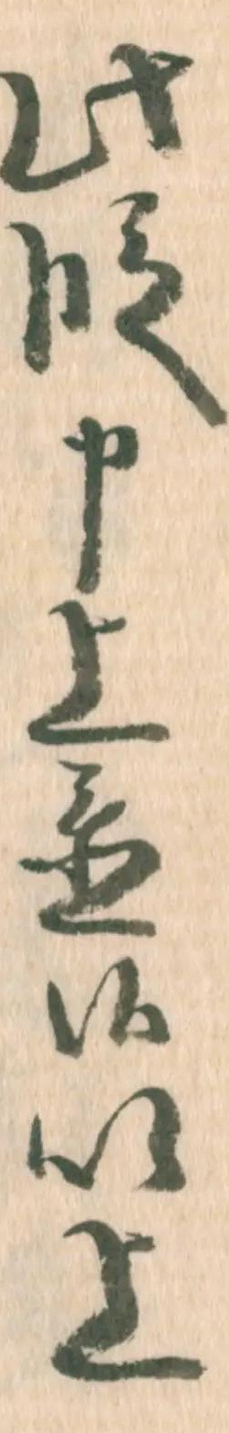此段申上置候以上
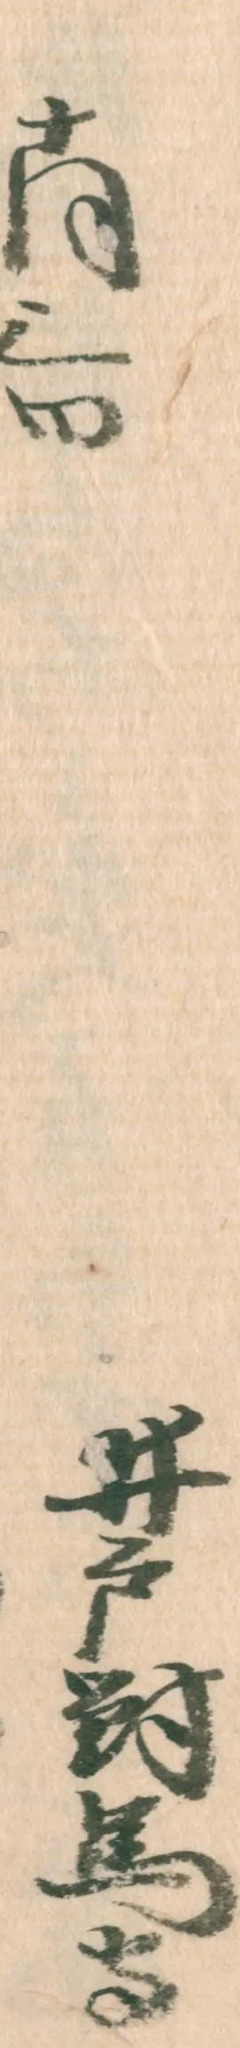十月三日井戸対馬守
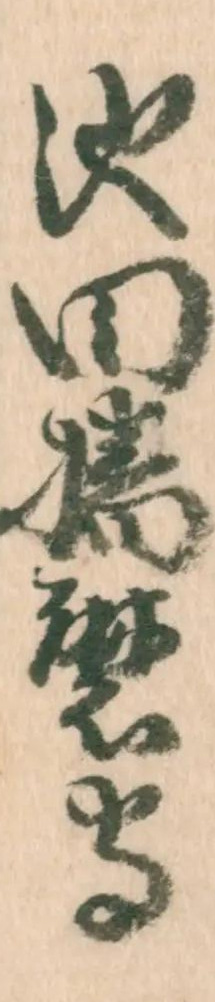池田播磨守
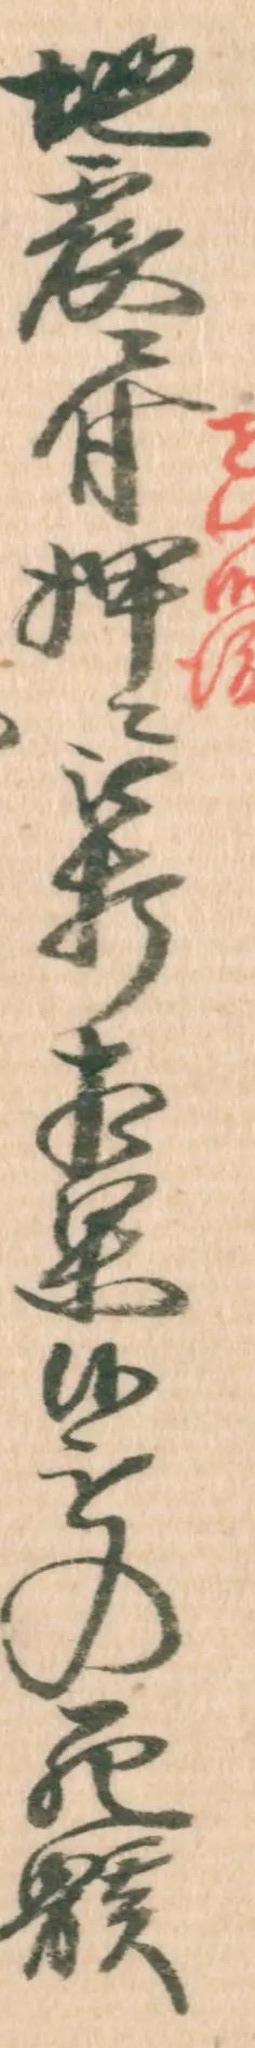│地震ニ付摧ニ被打相果候もの死骸
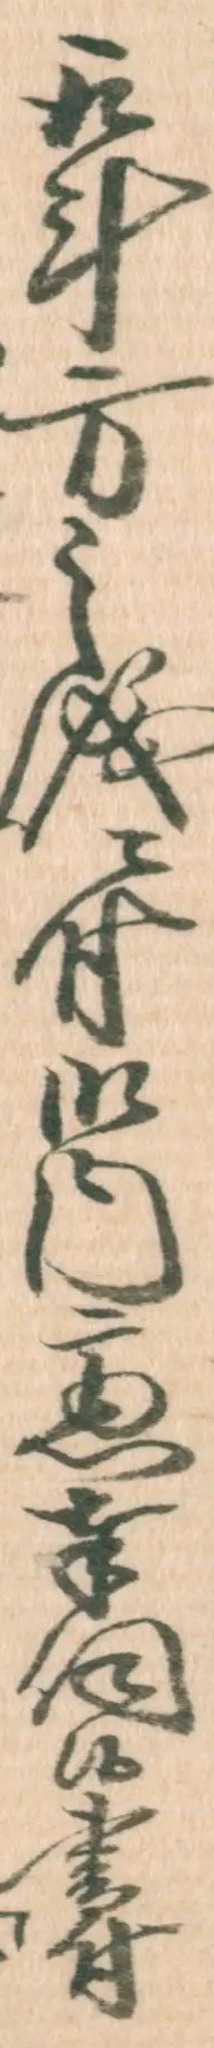│取計方之儀ニ付御内慮奉伺候書付

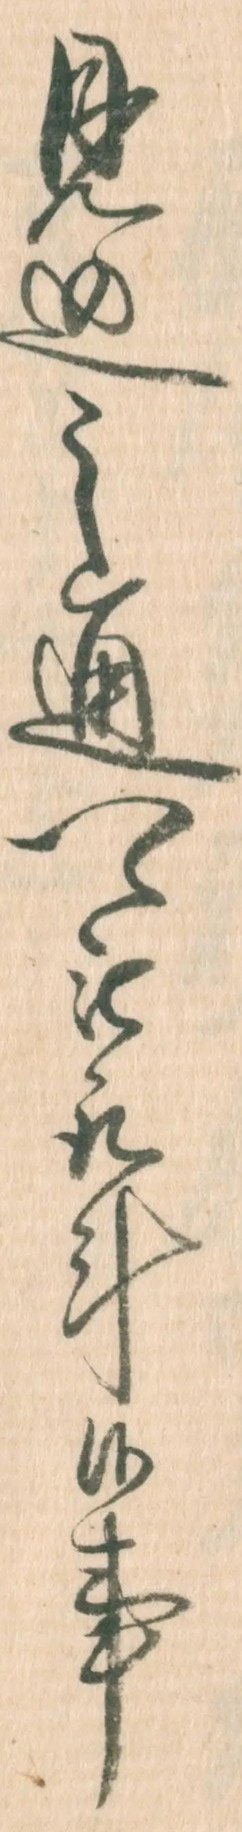見込之通可被取計候事

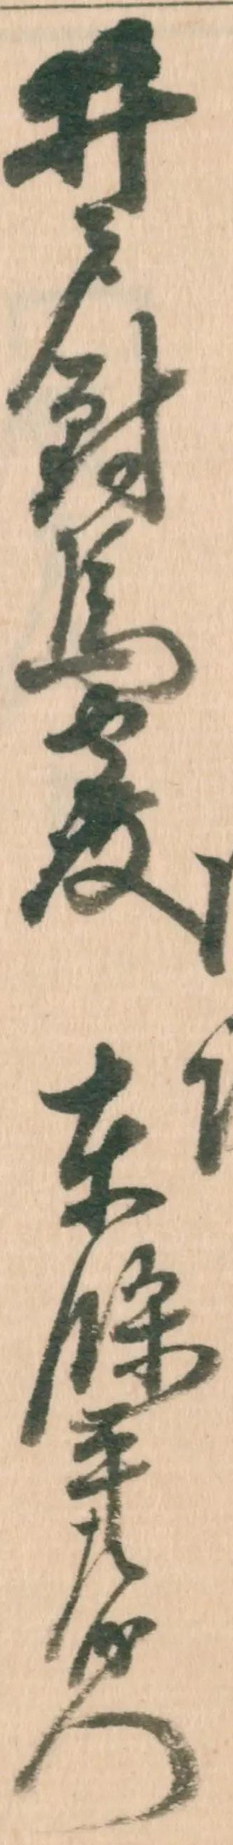│井戸対馬守殿東条平左衛門
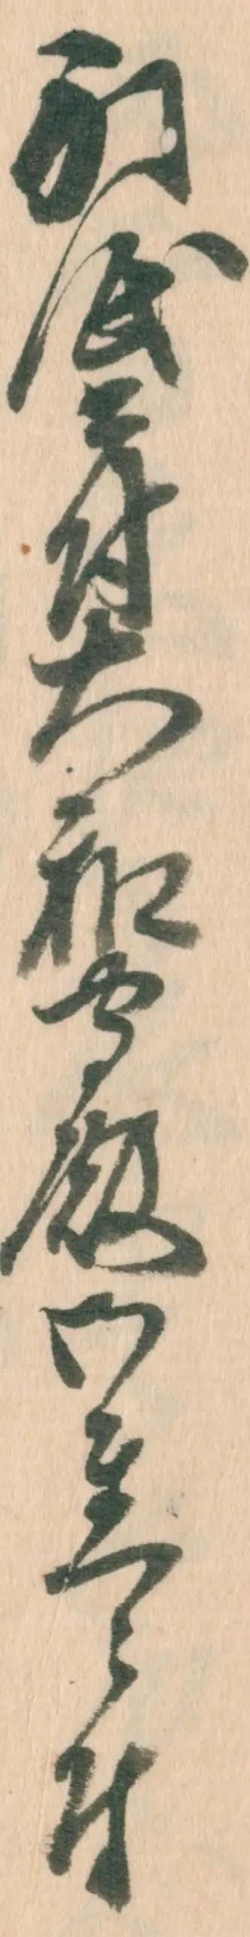別紙書付大和守殿御達ニ付
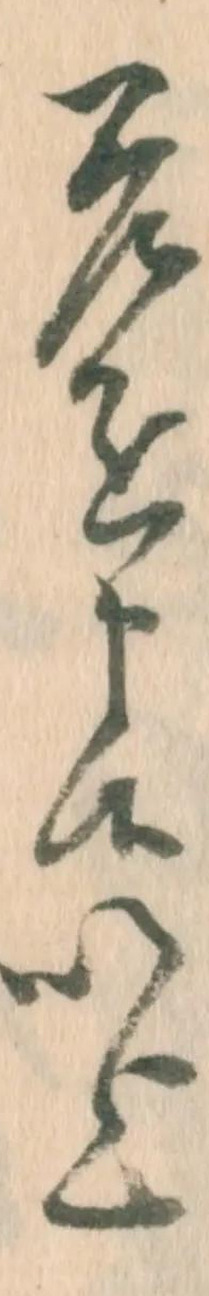差遣申候以上
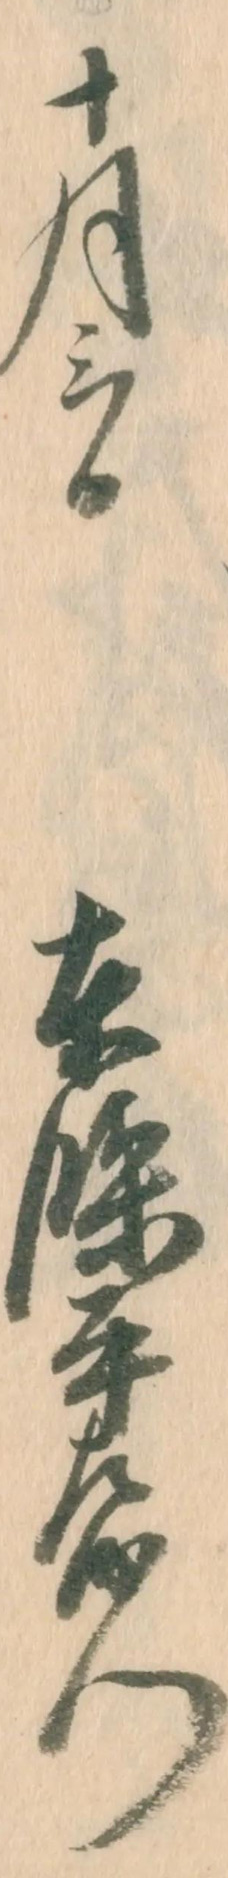十月三日東条平左衛門

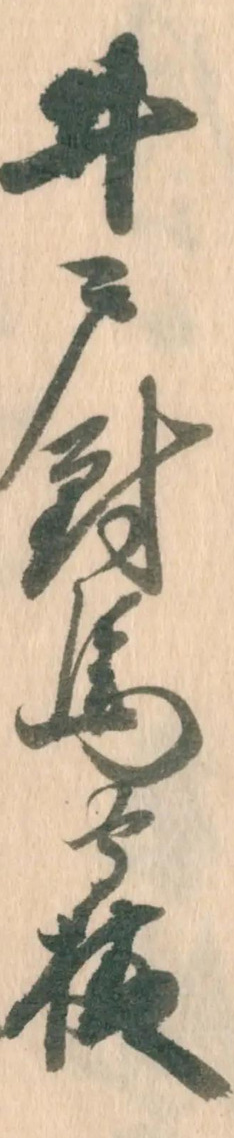井戸対馬守様
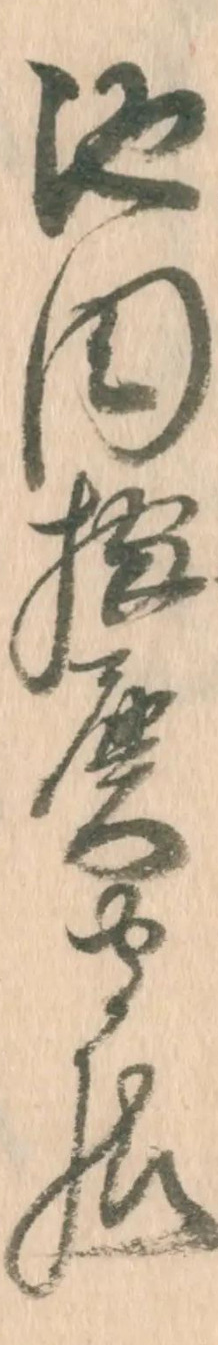池田播磨守様
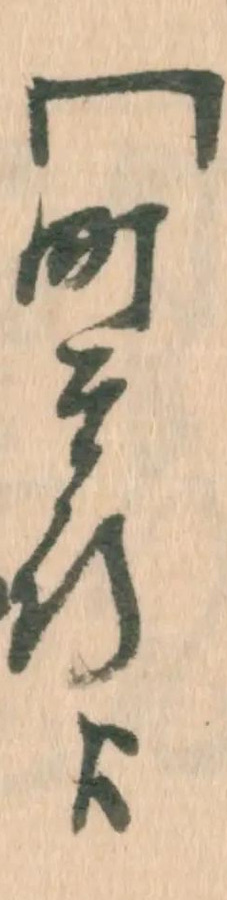│町奉行え
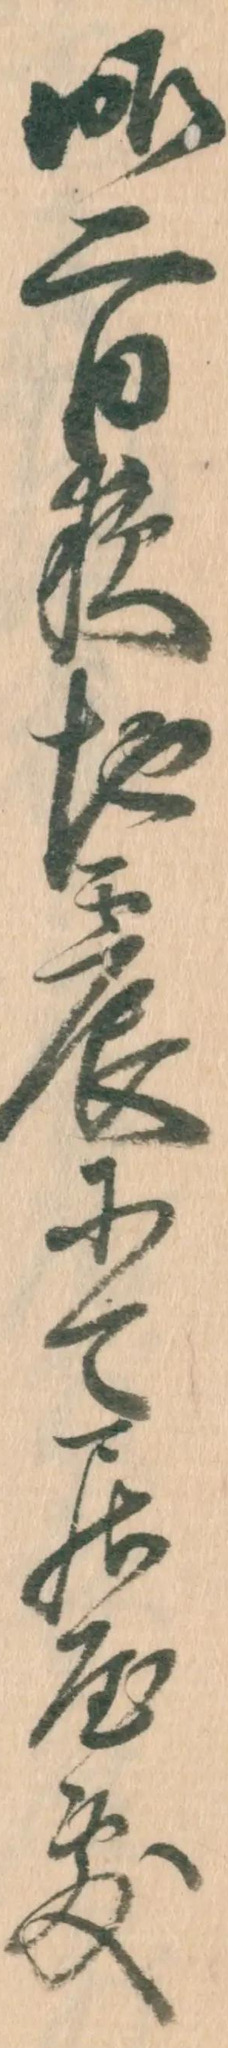昨二日夜地震にて居屋敷
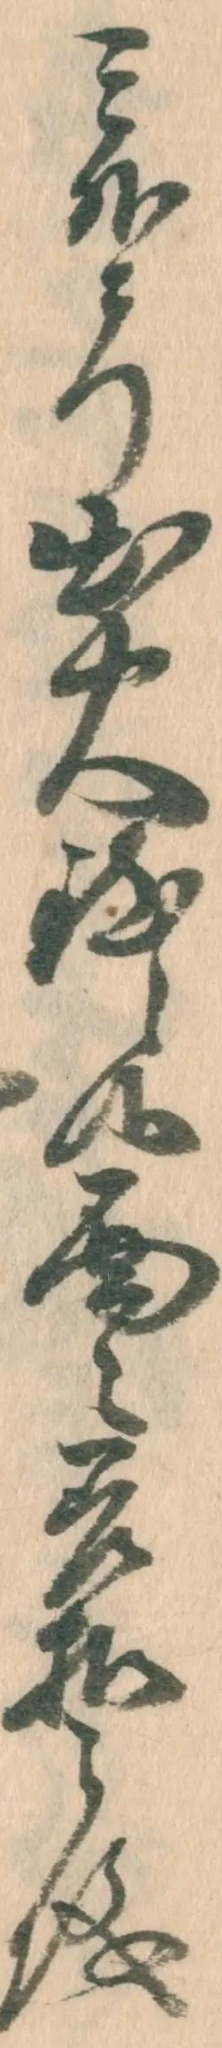其外ゟ出火致し候面〻差扣之儀
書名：地震災書留 2巻. [2] 内表紙に「地震一件　安政二卯年十月」とあり
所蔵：国立国会図書館 National Diet Library, JAPAN
